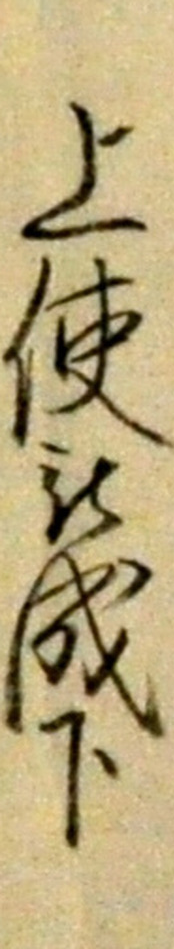上使被成下
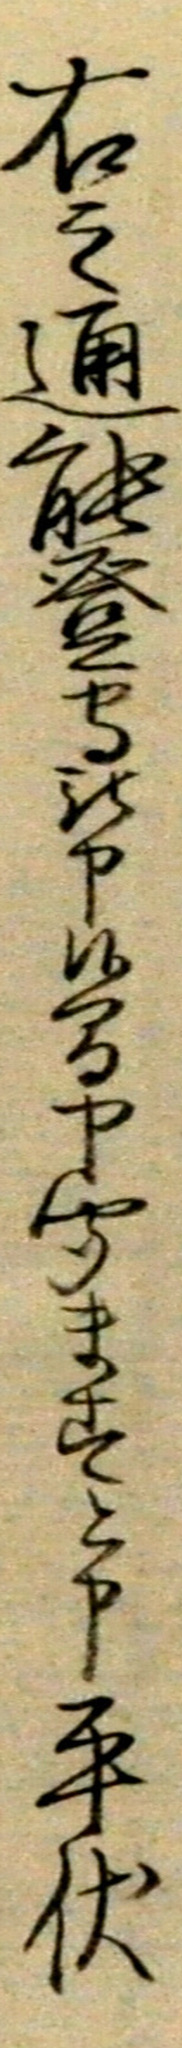右之通能登守被申候間申聞ますと申平伏
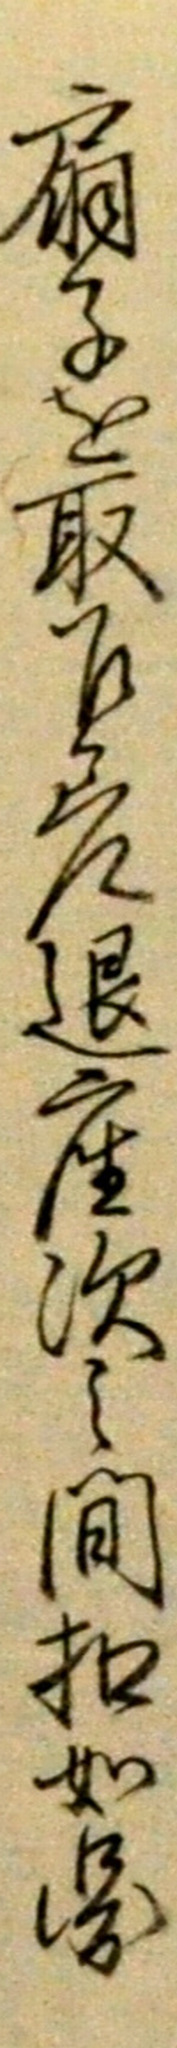扇子を取乍差退座次之間扣如図
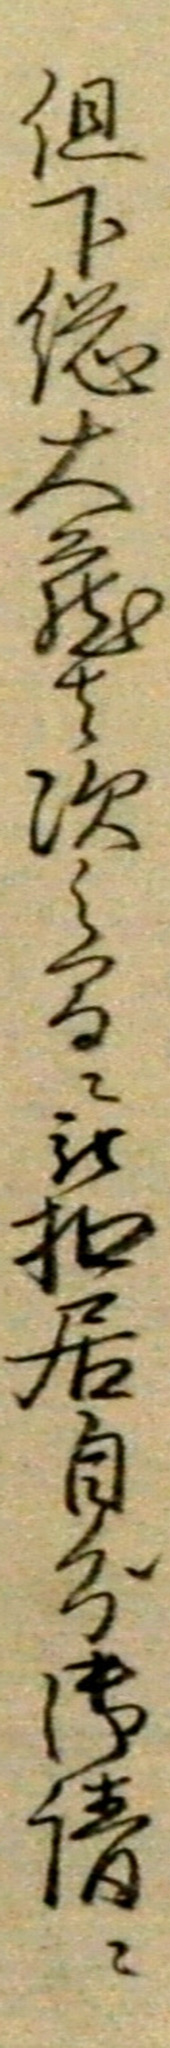但下総大蔵は次之間ニ被扣居自分御請ニ
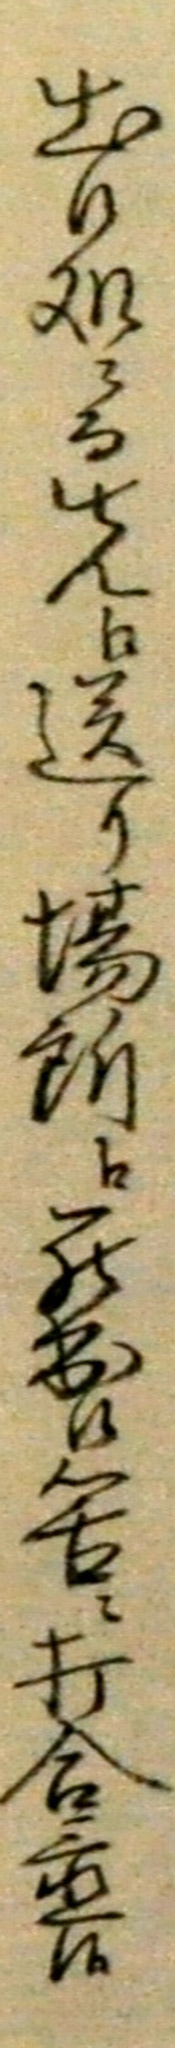出候処ニ而先え送り場所え罷出候筈ニ打合置候
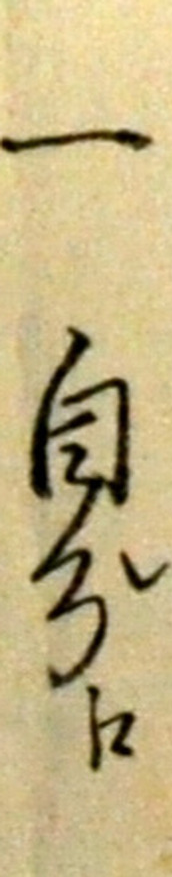一自分え

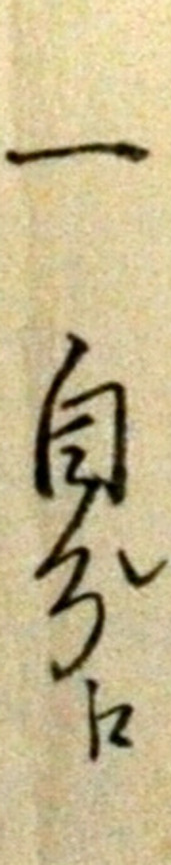一自分え
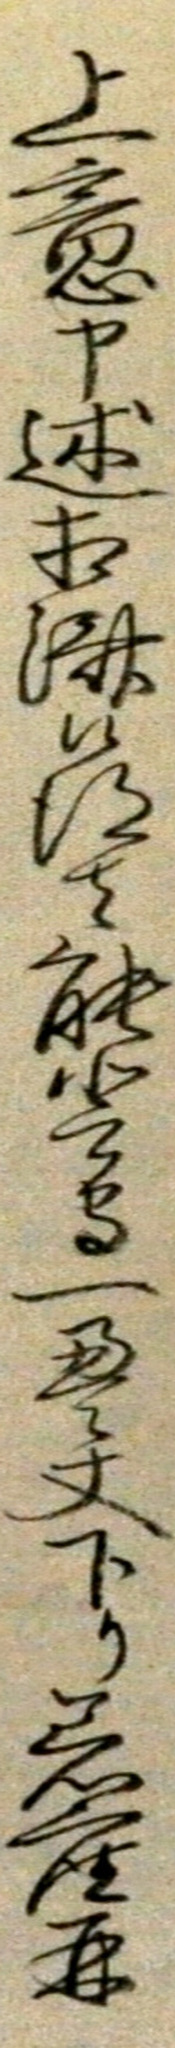上意申述相済候得は能登守一畳丈下り着座并
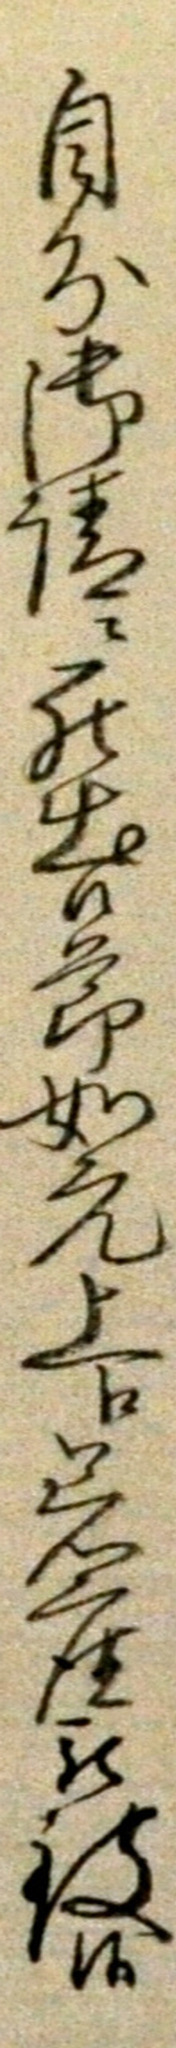自分御請ニ罷出候節如元上え着座被致候
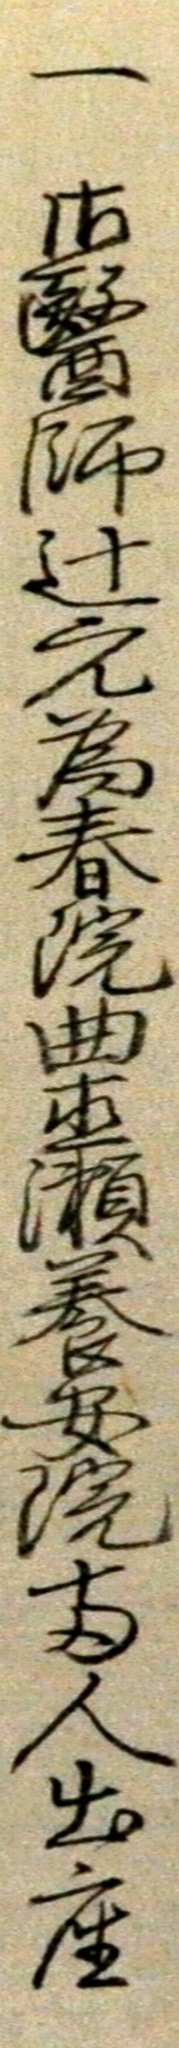一御医師辻元為春院曲直瀬養安院両人出座
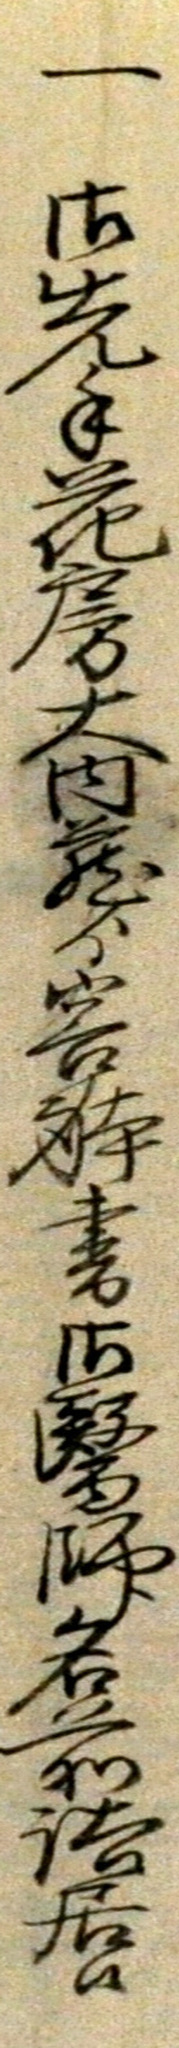一御先手花房大内蔵ゟ容躰書御医師名前読居候
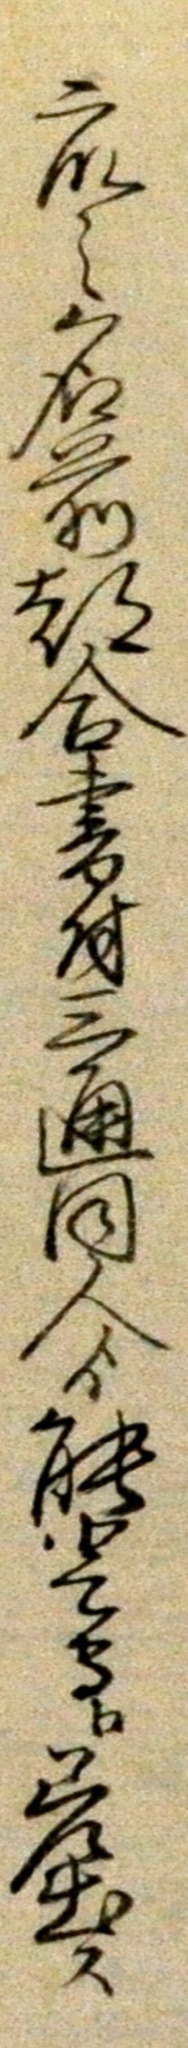衆之名前都合書付三通同人ゟ能登守え差出ス
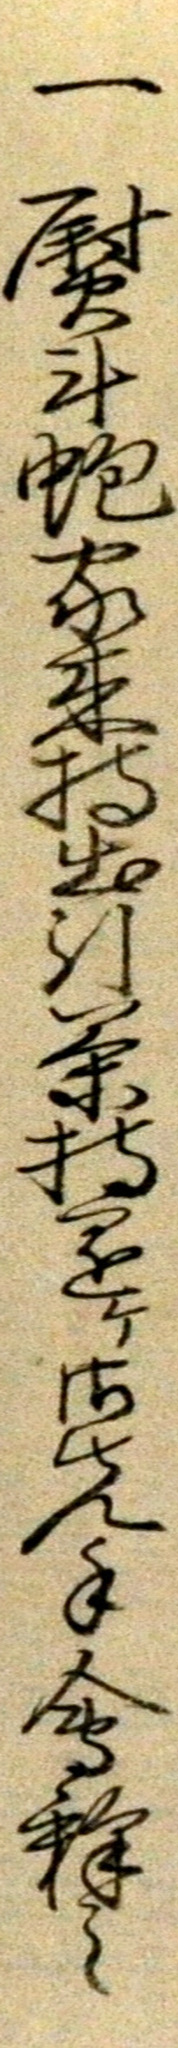一熨斗蚫家来持出引茶持懸ケ御先手会釈之
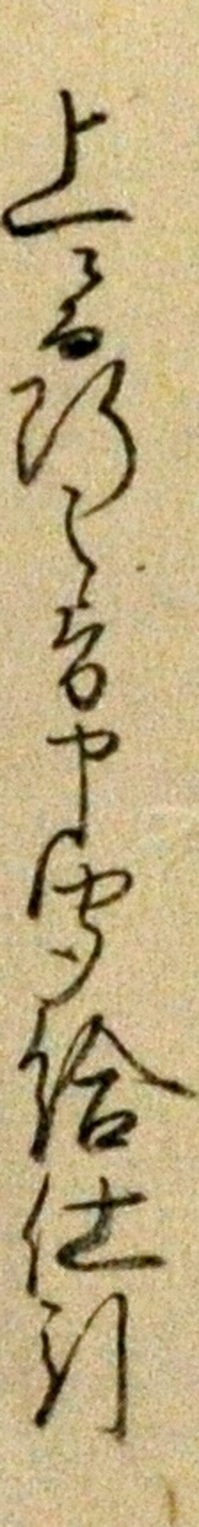上ニ而断之旨申聞給仕引
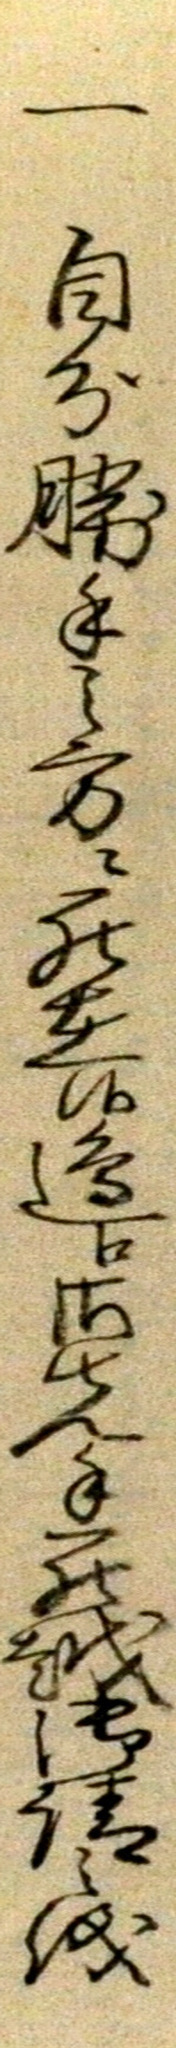一自分勝手之方ニ罷在候辺ニ御先手罷越御請之儀
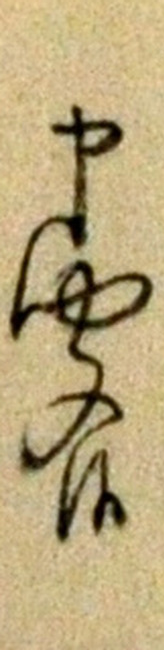申聞候
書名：上使仰付ラレ候節ノ留外
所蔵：伊那市立高遠町図書館・合同会社AMANE
